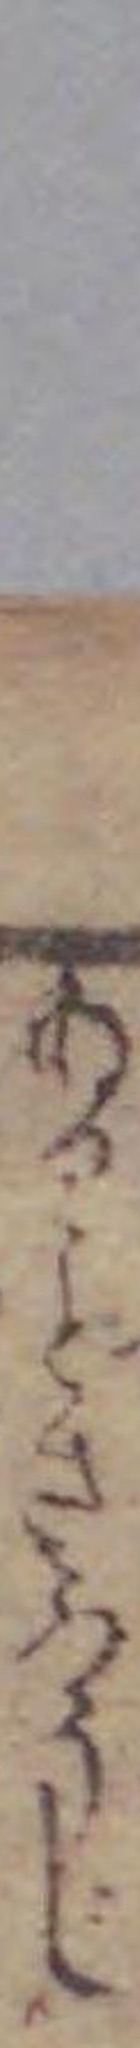あることさふうじ
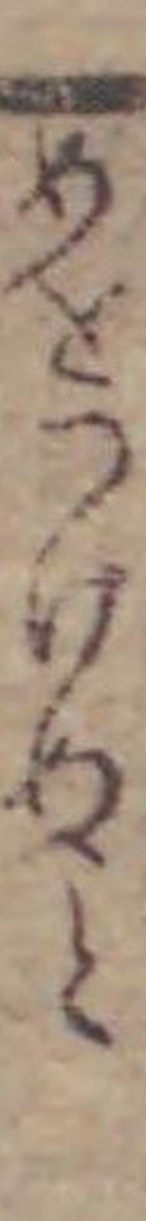めをつけぬと
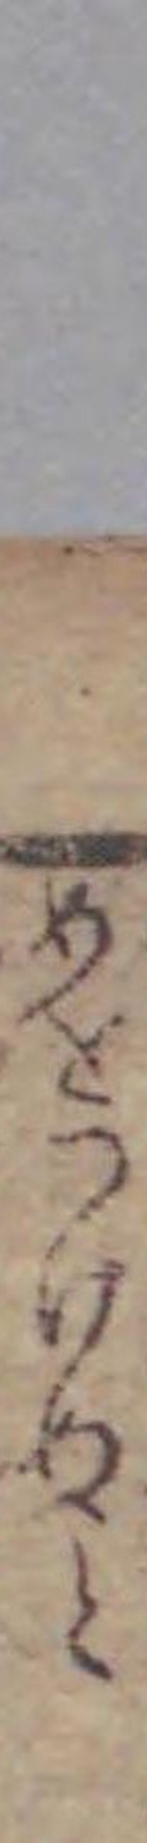めをつけぬと
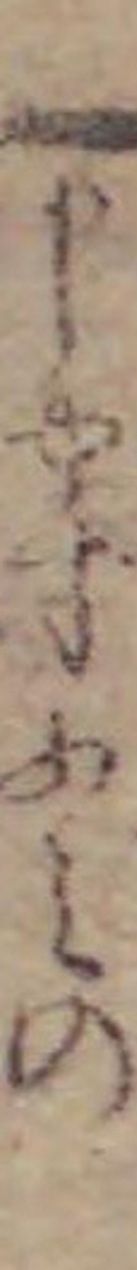申しやすふみの
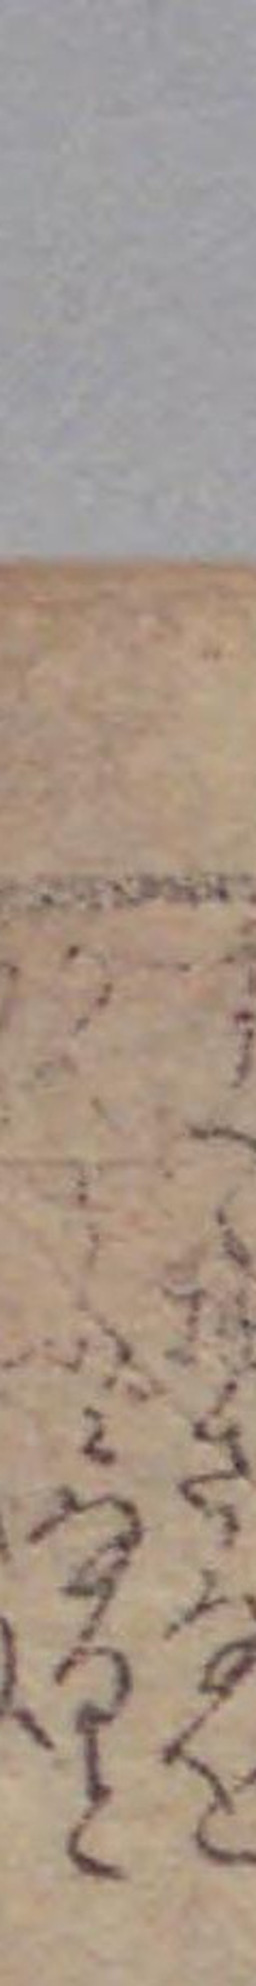かくよふになると

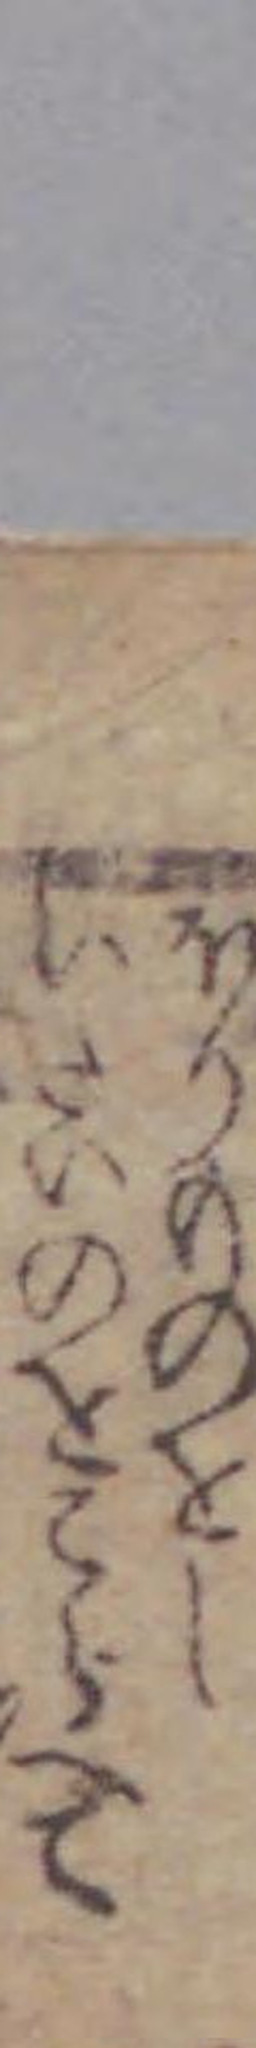いたいのをこらへて
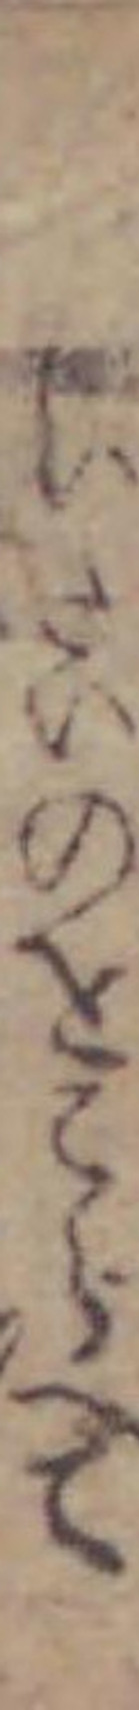いたいのをこらへて
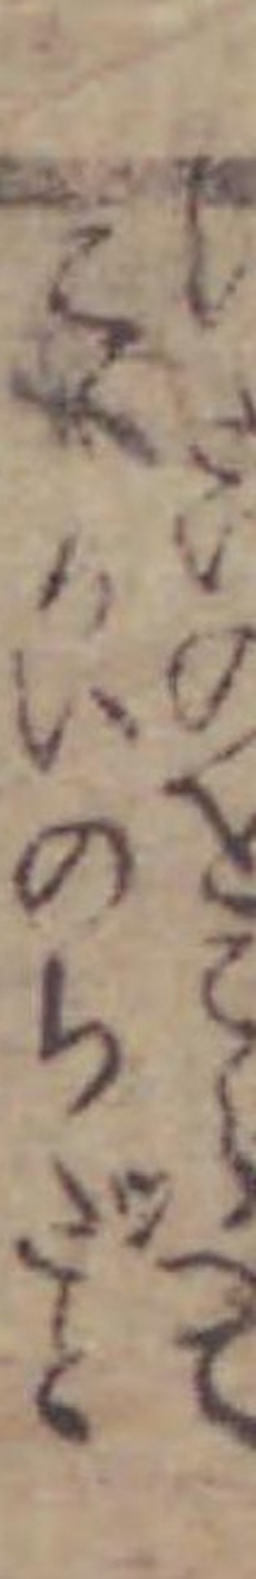こゝかいのちだと
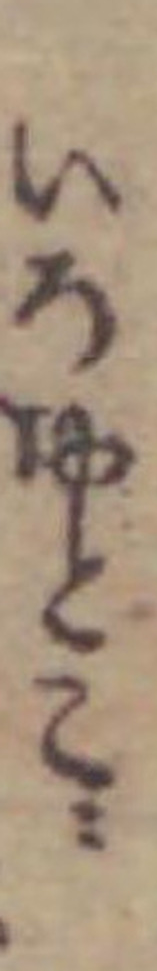いろおとこに
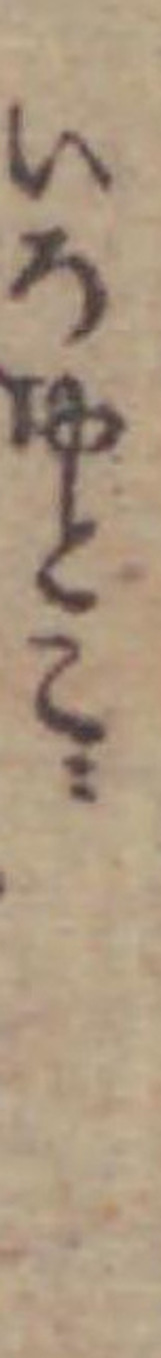いろおとこに
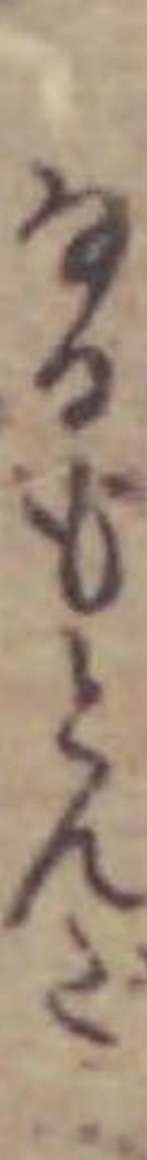なるもとんだ
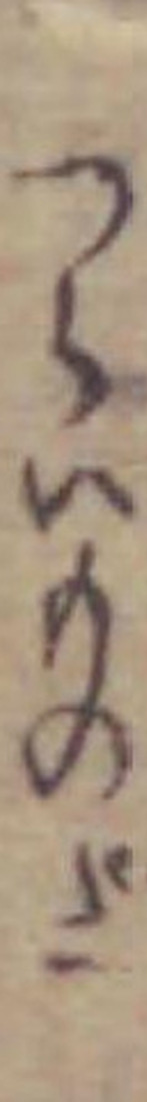つらいものだ
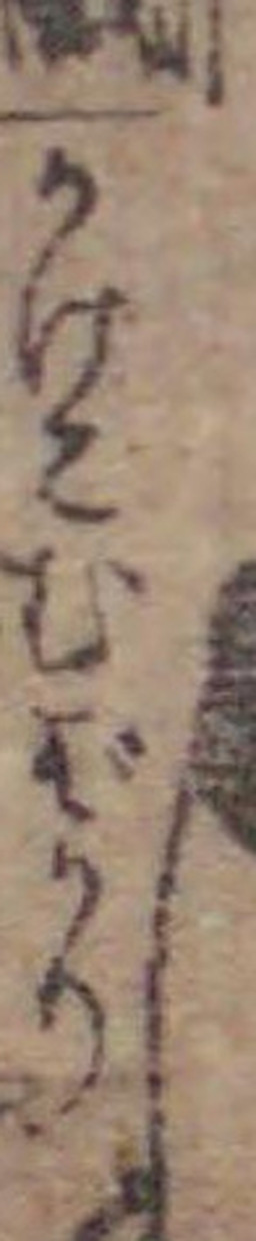かけこむばかり
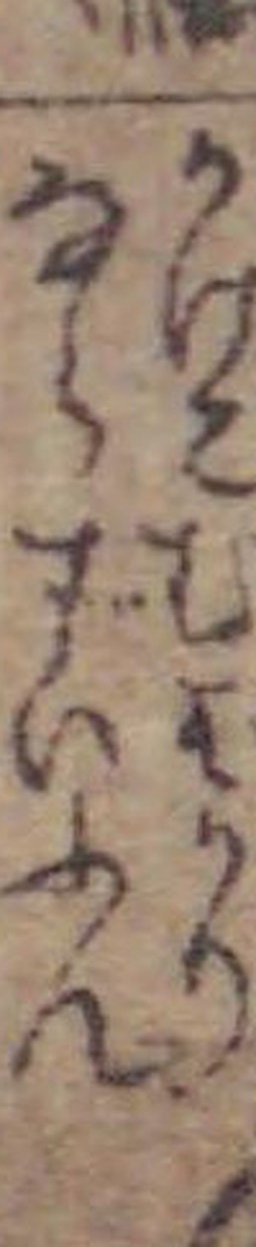ならずいふん
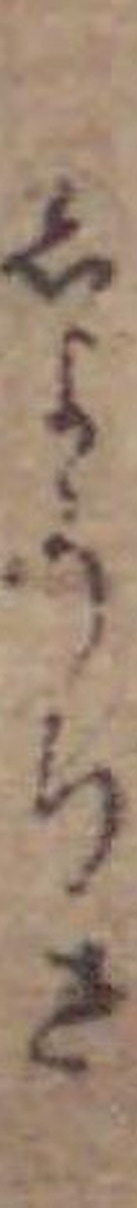しようちさ

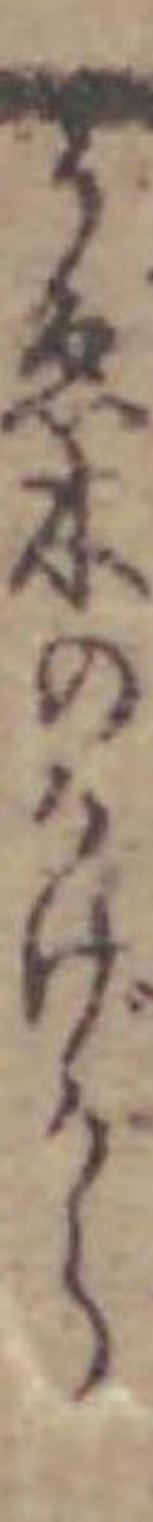うゑ木のかげから
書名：江戸生艶気樺焼 : 3巻
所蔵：国立国会図書館 National Diet Library, JAPAN
